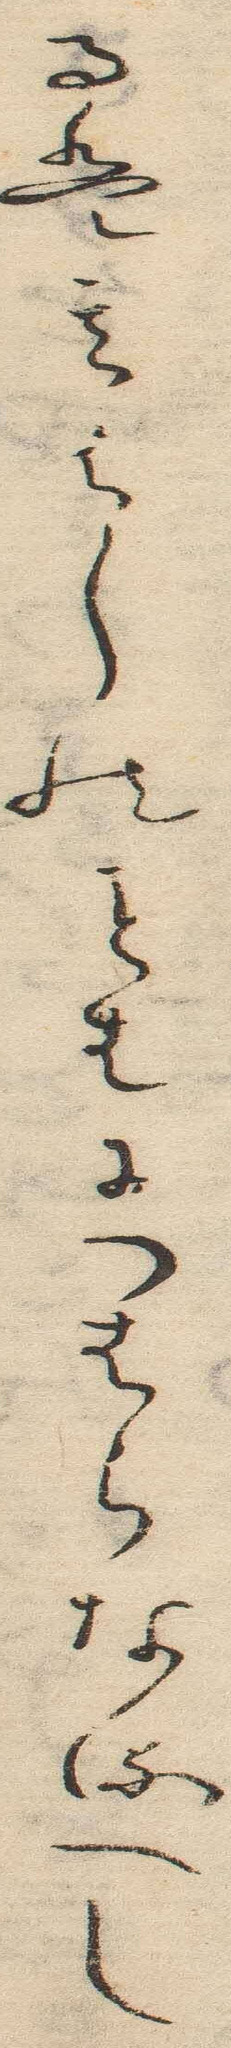るは其はしのことはにつはらなるへし

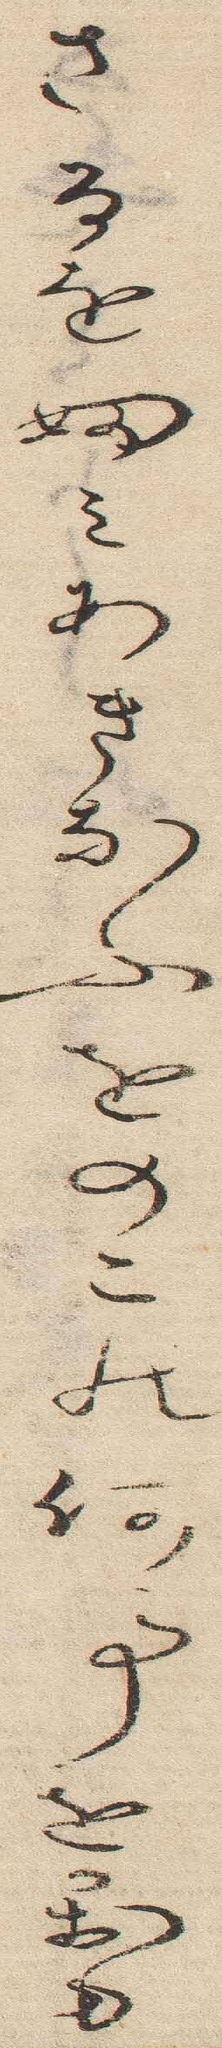さるをふみあきなふをのこの何事をおも
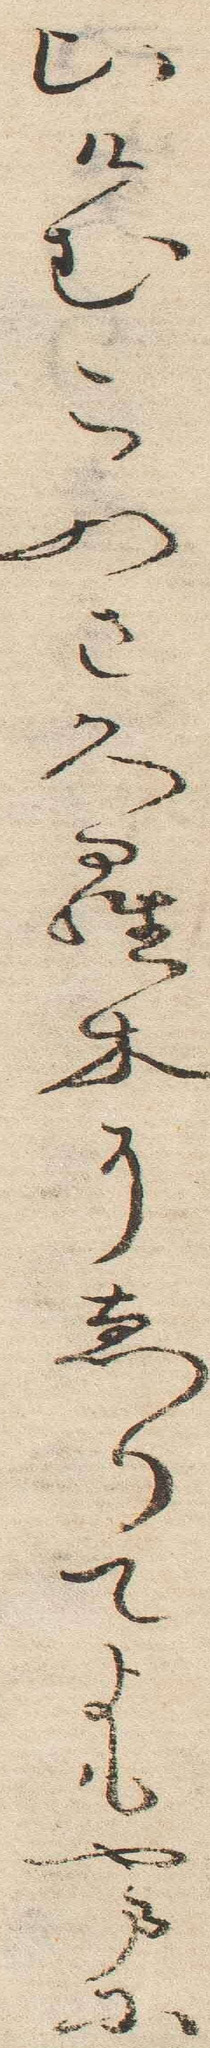ひけむこれさくら木にゑりてよもやまに
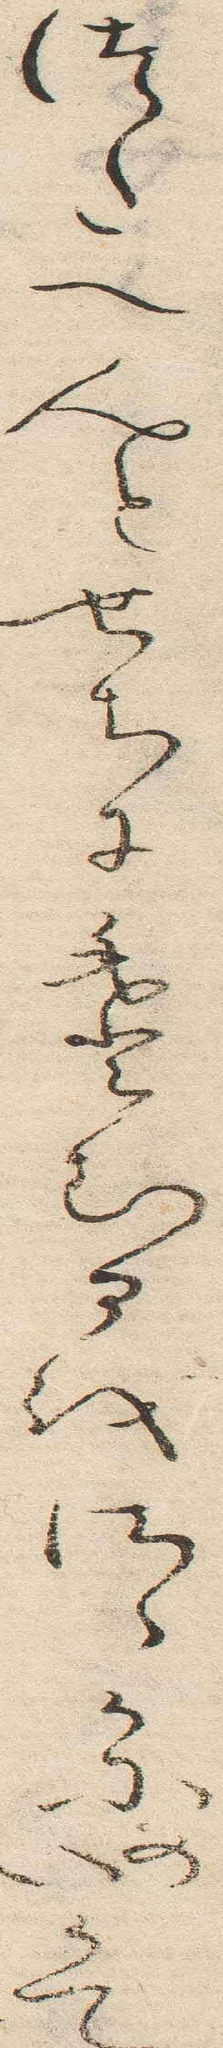つたへんとせちにもとむるをさゝかにのいかて
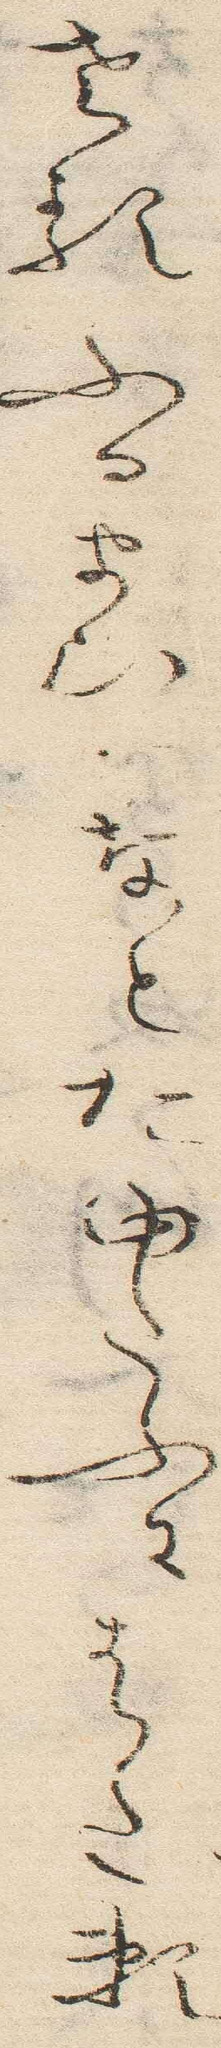せるふるまひなとたゆたふにはた頼
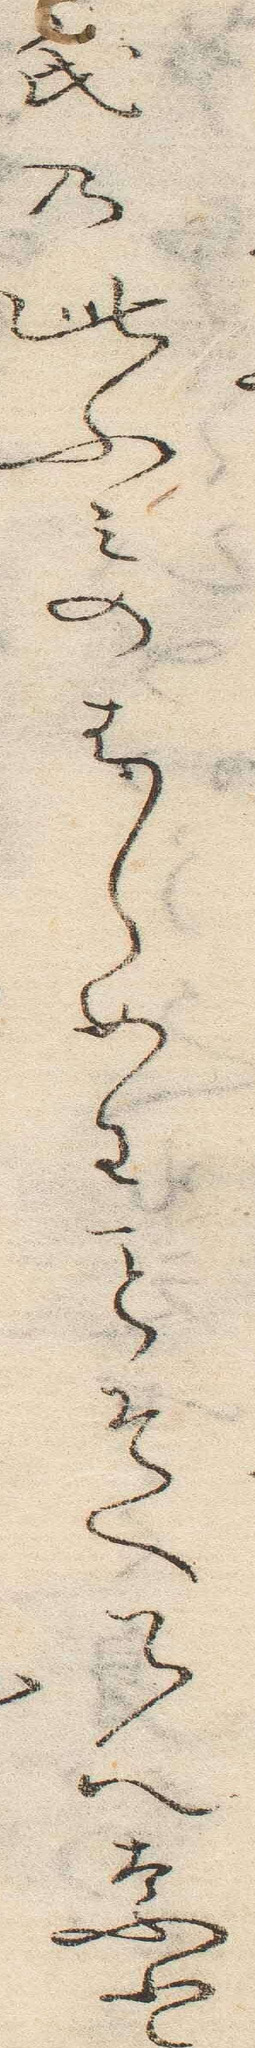氏の此ふみのはしめにことそへてんなと
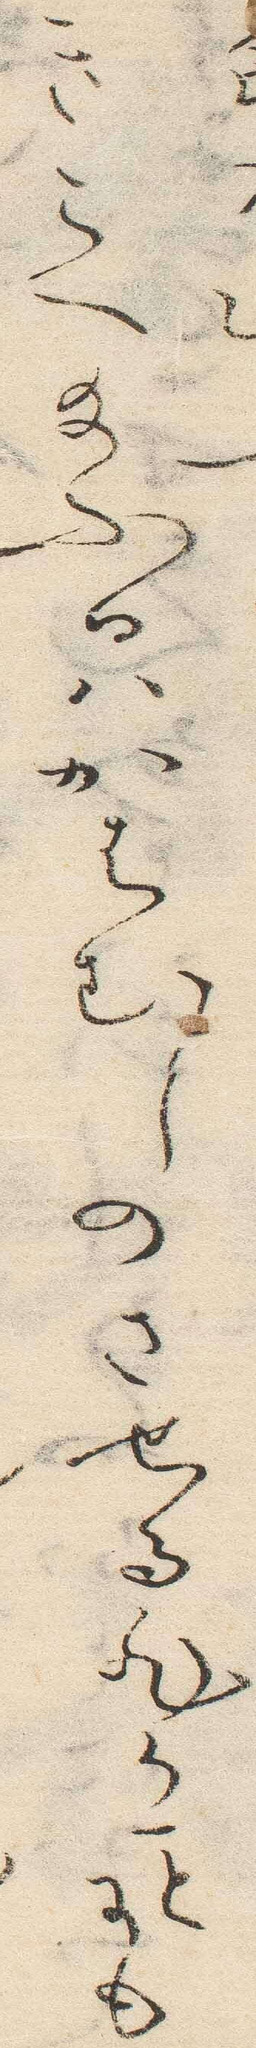きこへ給ふるはかはむしのさせるひかことにも
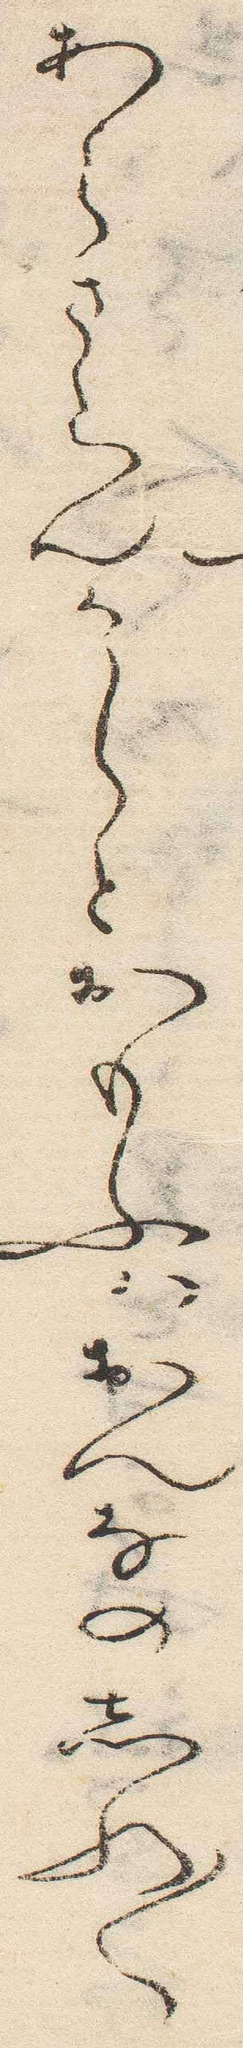あらさらんかしとおもふはおんなのしれ〳〵
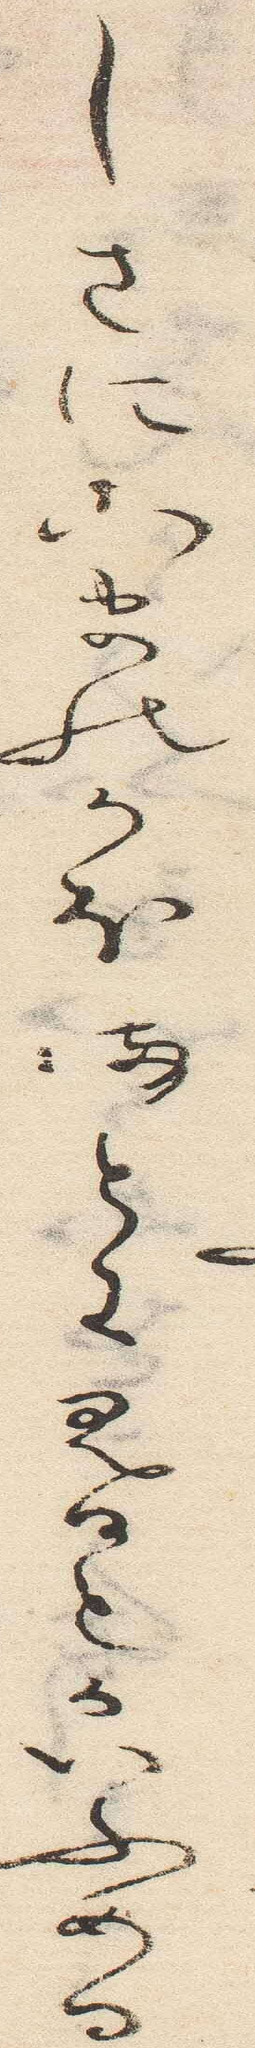しさにこまのかほまとにくるとかいふめる
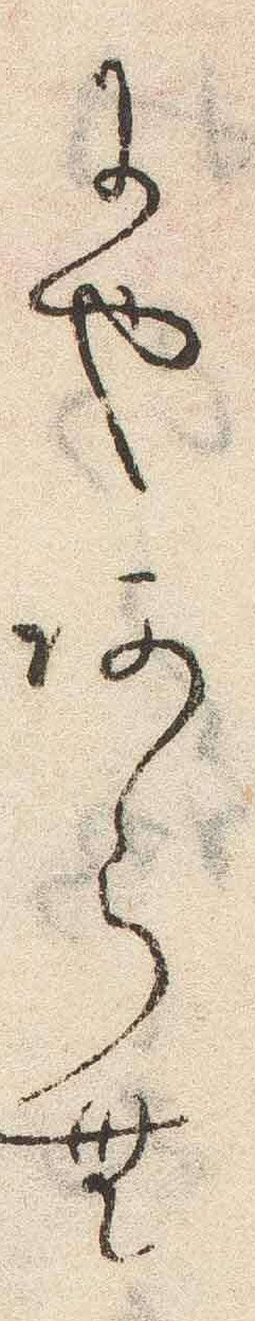にやあらむ
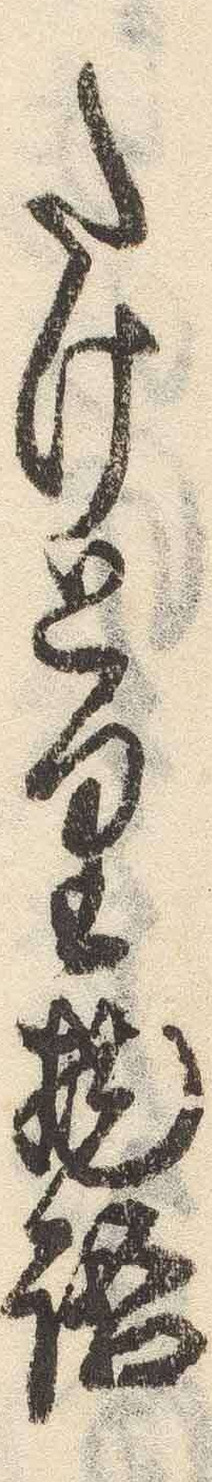たけとり物語
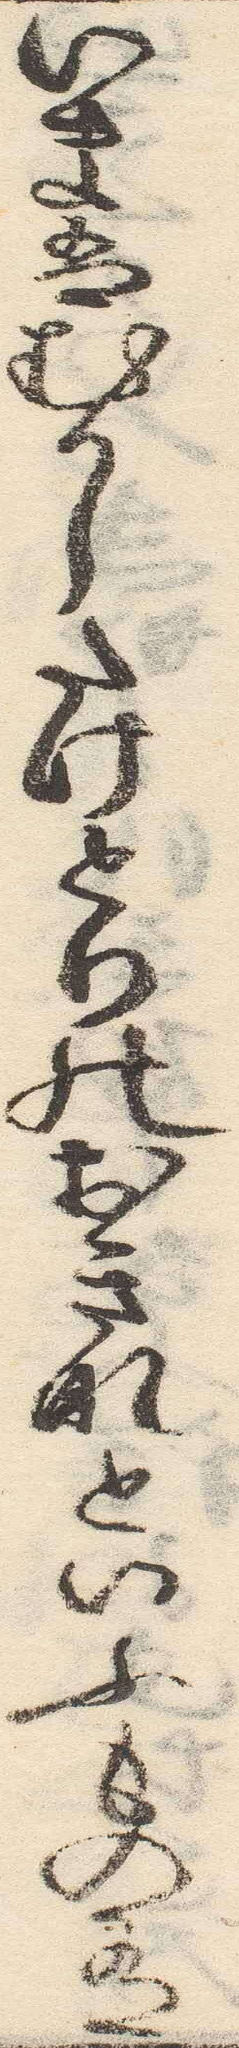いまはむかしたけとりのおきなといふもの有
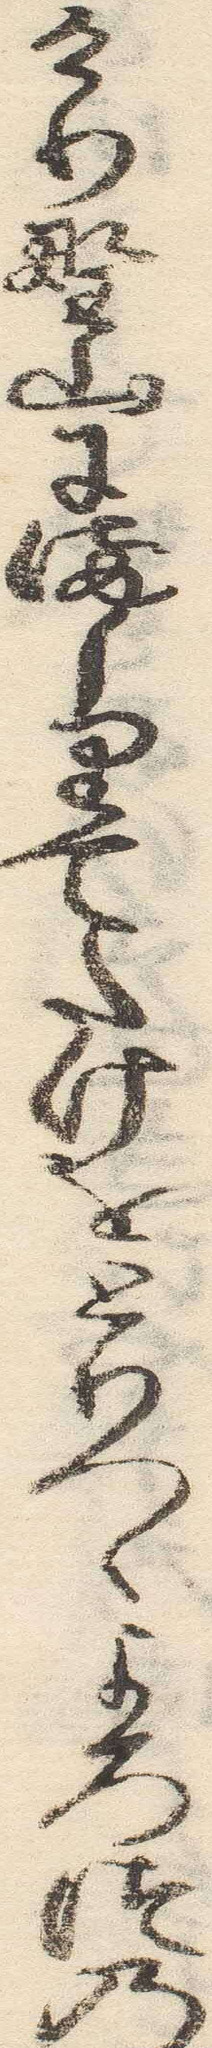けり野山にましりてたけをとりつゝよろつの
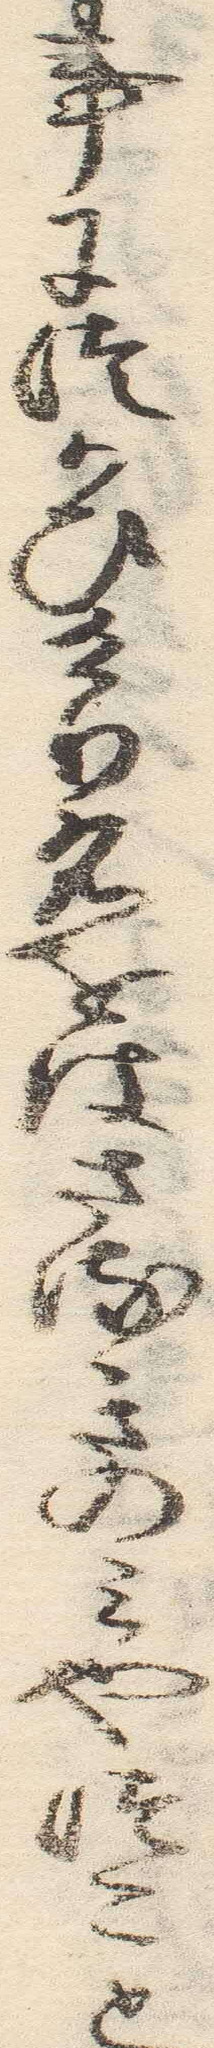事につかひけり名をはさるきのみやつこと
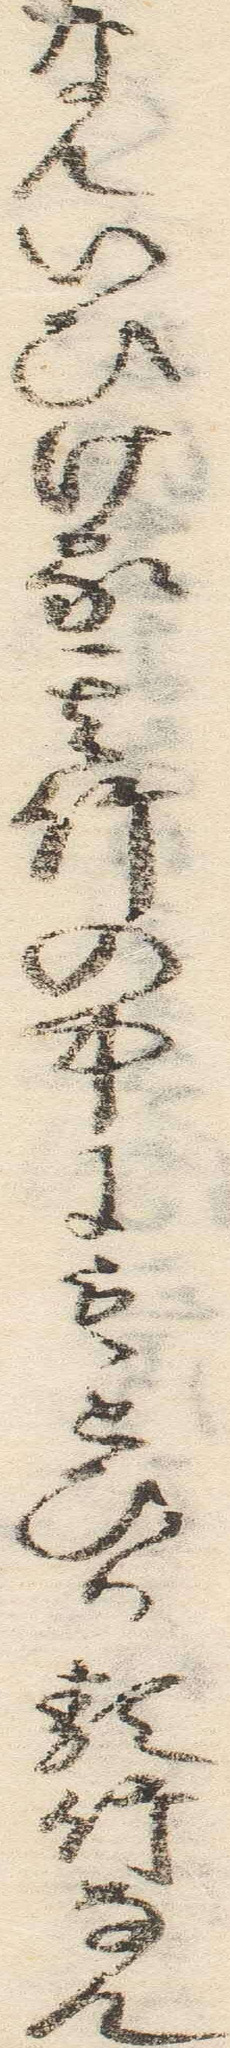なんいひける其竹の中にもとひかる竹なん
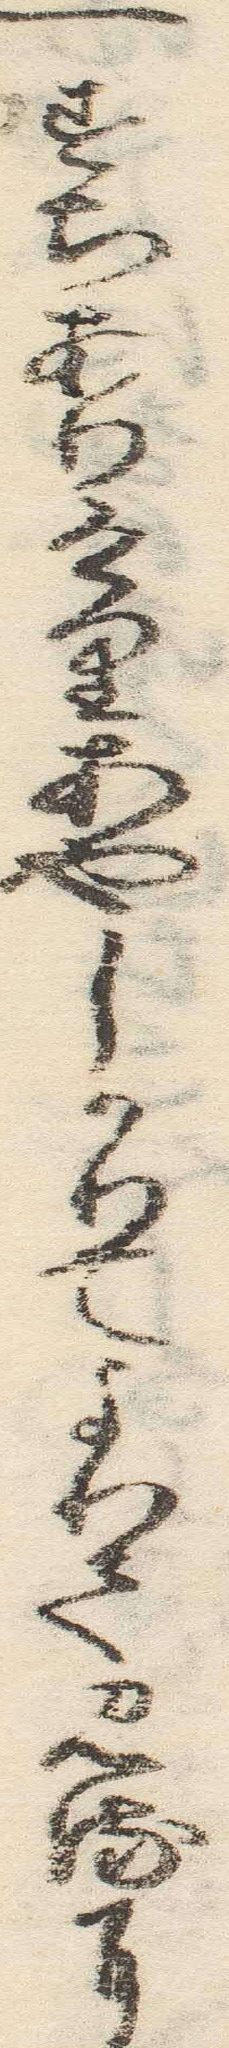一すちありけりあやしかりてよりて見るに
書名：竹取物語
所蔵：東京学芸大学附属図書館 国文学研究資料館
